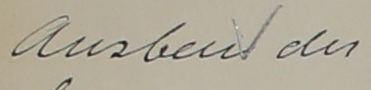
Ausbau der
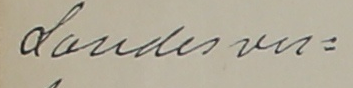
Landesver-
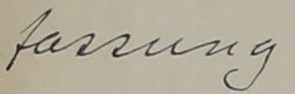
fassung
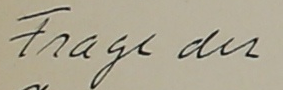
Frage der
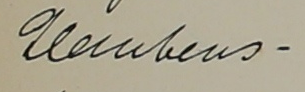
Glaubens-
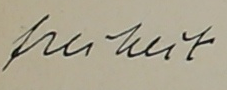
freiheit
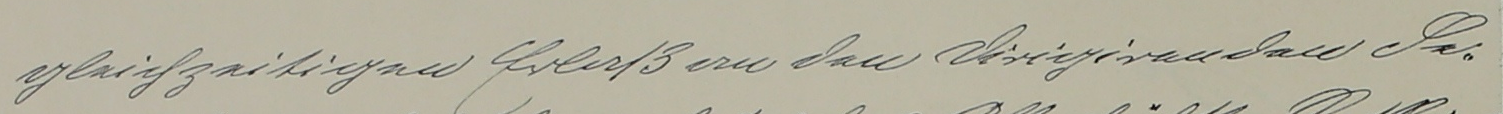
gleichzeitigen Erlaß an den Dirigirenden Se-
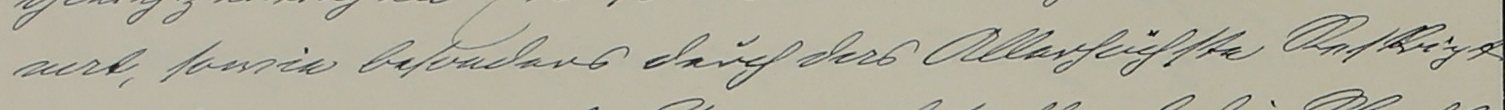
nat, sowie besonders durch das Allerhöchste Reskript
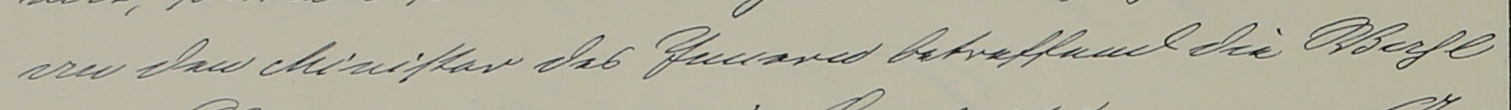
an den Minister des Innern betreffend die Wahl
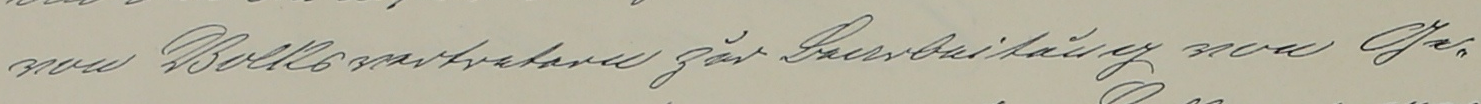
von Volksvertretern zur Bearbeitung von Ge-
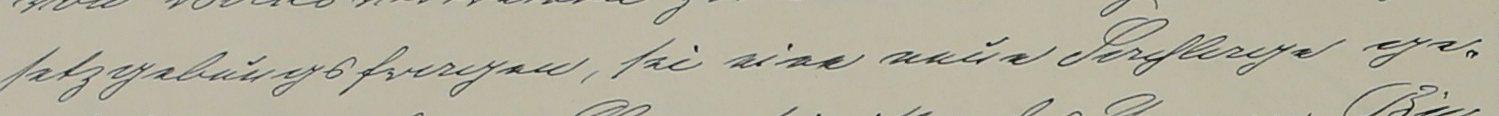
setzgebungsfragen, sei eine neue Sachlage ge-
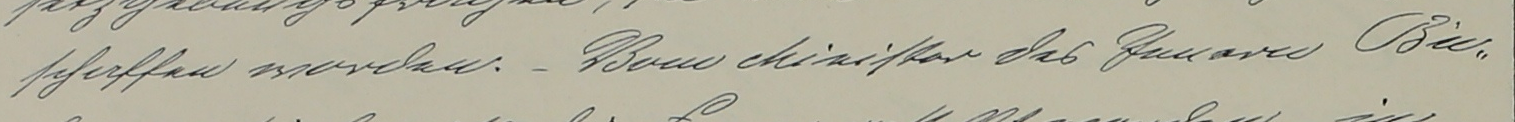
schaffen worden. - Vom Minister des Innern Bu-
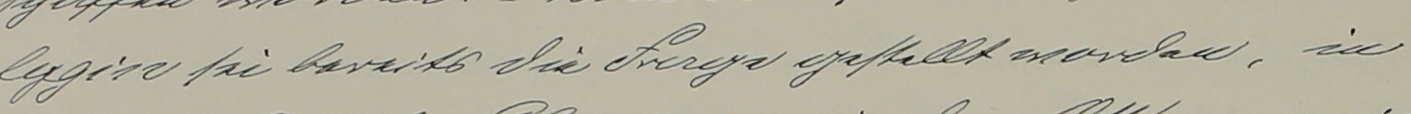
lygin sei bereits die Frage gestellt worden, in
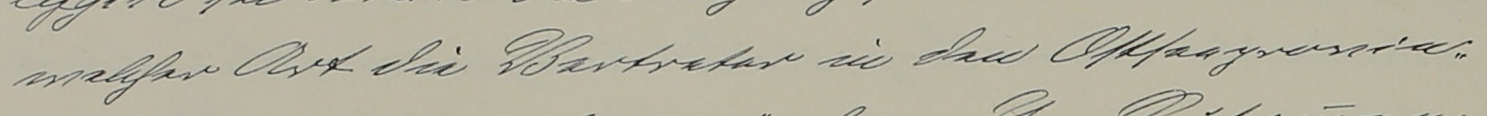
welcher Art die Vertreter in den Ostseeprovin-
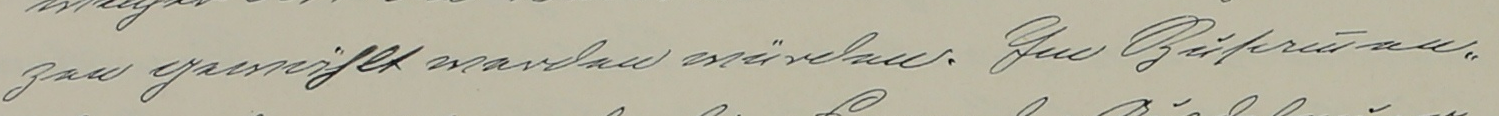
zen gewählt werden würden. Im Zusammen-
